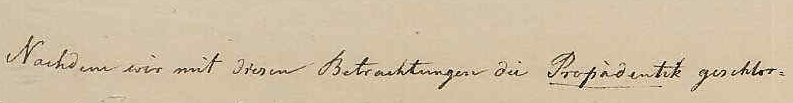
Nachdem wir mit diesen Betrachtungen die Propädeutik geschlos-
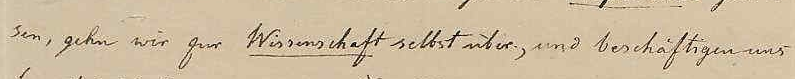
sen, gehn wir zur Wissenschaft selbst über, und beschäftigen uns
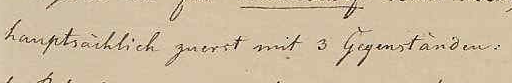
hauptsächlich zuerst mit 3 Gegenständen:
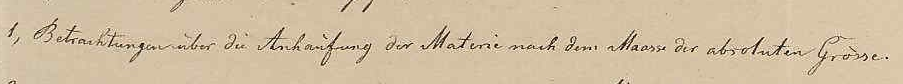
1, Betrachtungen über die Anhäufung der Materie nach dem Maasse der absoluten Grösse.
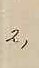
2,
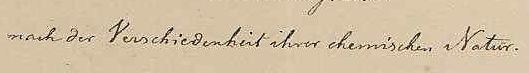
nach der Verschiedenheit ihrer chemischen Natur.
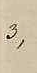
3,
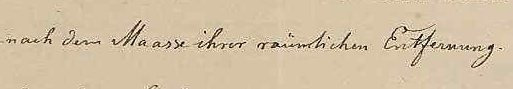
nach dem Maasse ihrer räumlichen Entfernung.
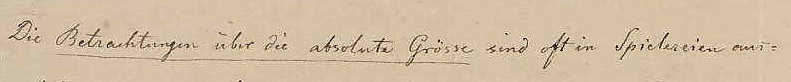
Die Betrachtungen über die absolute Grösse sind oft in Spielereien aus-
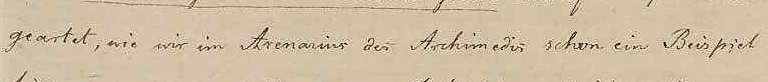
geartet, wie wir im Arenarius des Archimedis schon ein Beispiel
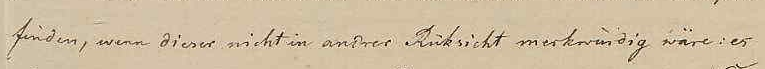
finden, wenn dieser nicht in andrer Rücksicht merkwürdig wäre: es
